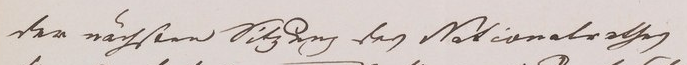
der nächsten Sitzung des Nationalrathes
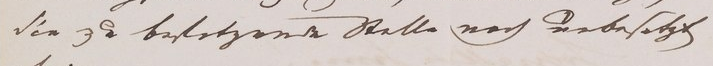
die zu besetzende Stelle noch unbesetzt
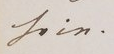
sein.
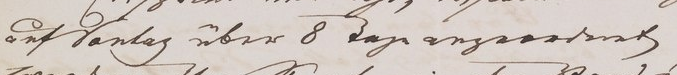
auf Sontag über 8 Tage angeordnet
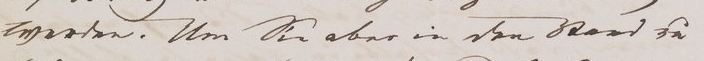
werden. Um Sie aber in den Stand zu
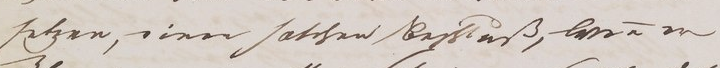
setzen, einen solchen Beschluß, wenn er
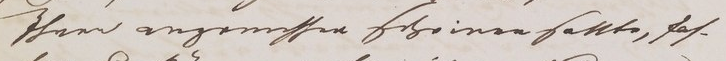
Ihnen angemessen scheinen sollte, fas-
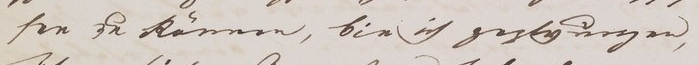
sen zu können, bin ich gezwungen,
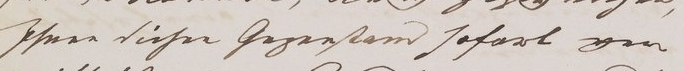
Ihnen diesen Gegenstand sofort ver-
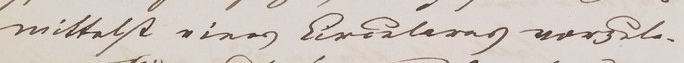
mittelst eines Circulares vorzule-
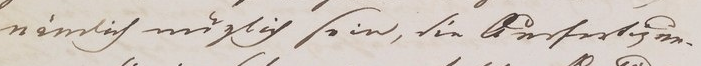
nämlich möglich sein, die Ausfertigun-
